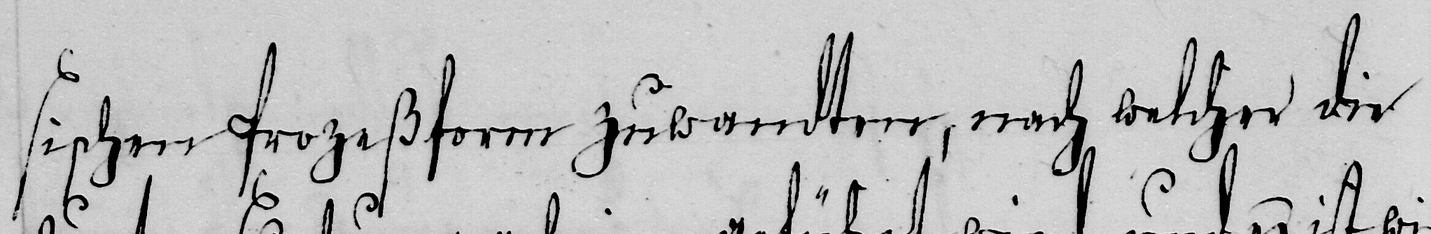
sischen Prozeßform zuwandten, nach welcher die
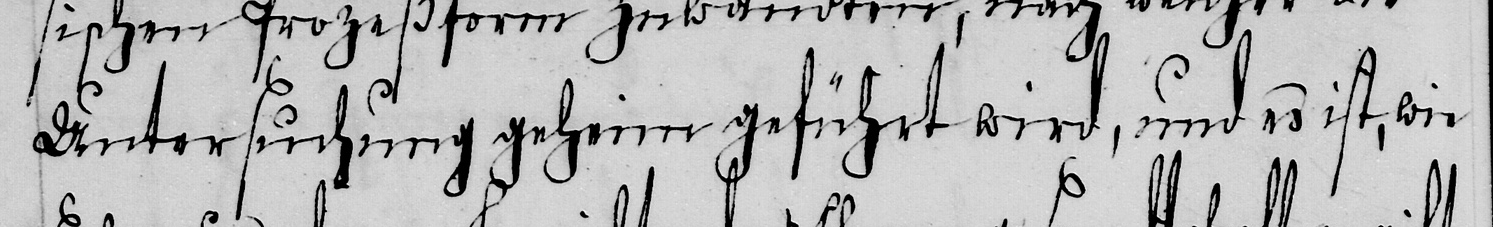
Untersuchung geheim geführt wird, und es ist, wie
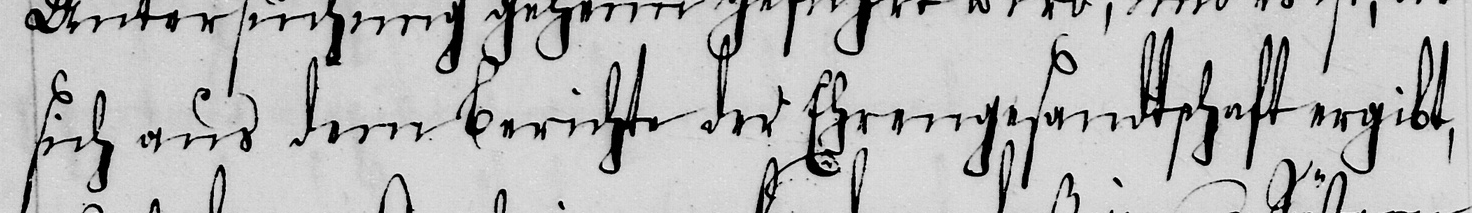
sich aus dem Berichte der Ehrengesandtschaft ergibt,
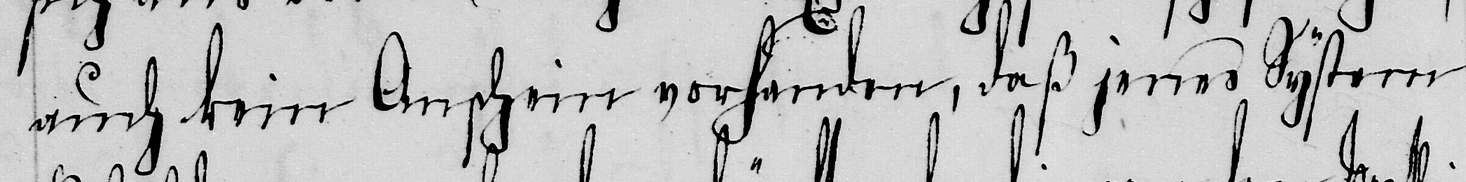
auch kein Anschein vorhanden, daß jenes System
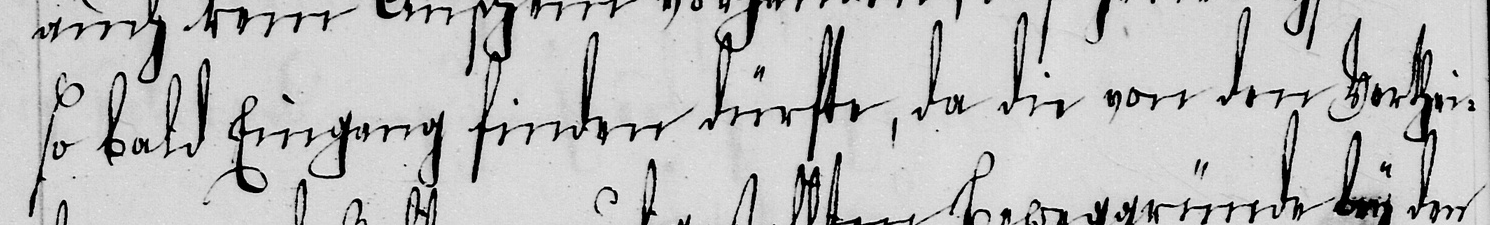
so bald Eingang finden dürfte, da die von den Verthe¬
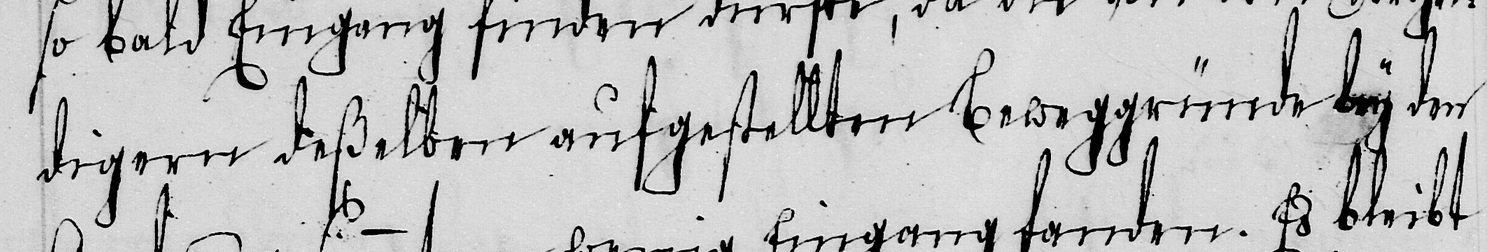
idigern deßelben aufgestellten Beweggründe bey den
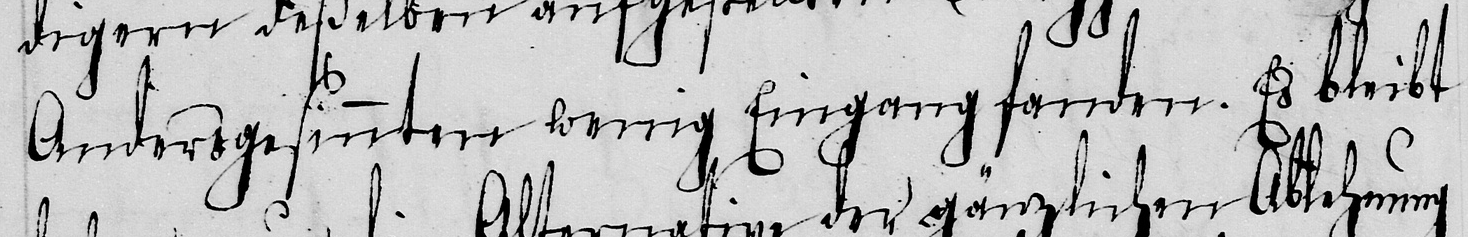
Andersgesinnten wenig Eingang fanden. Es bleibt
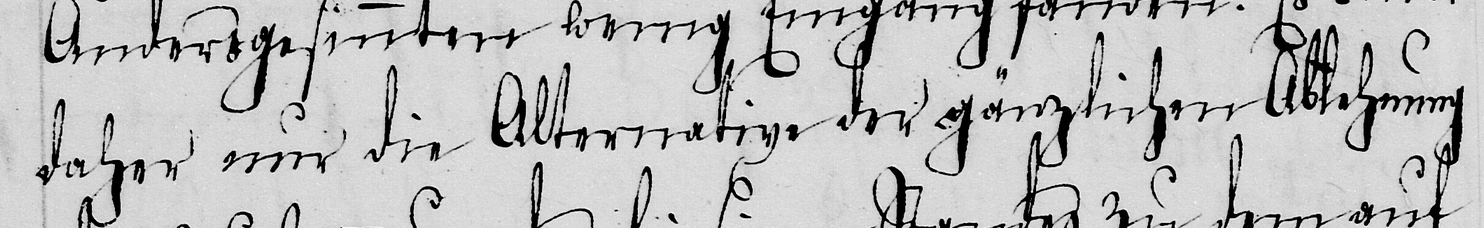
daher nur die Alternative der gänzlichen Ablehnung
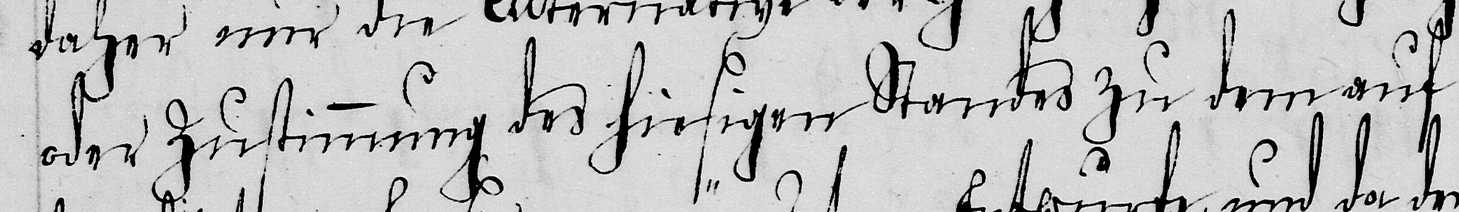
oder Zustimmung des hiesigen Standes zu dem auf
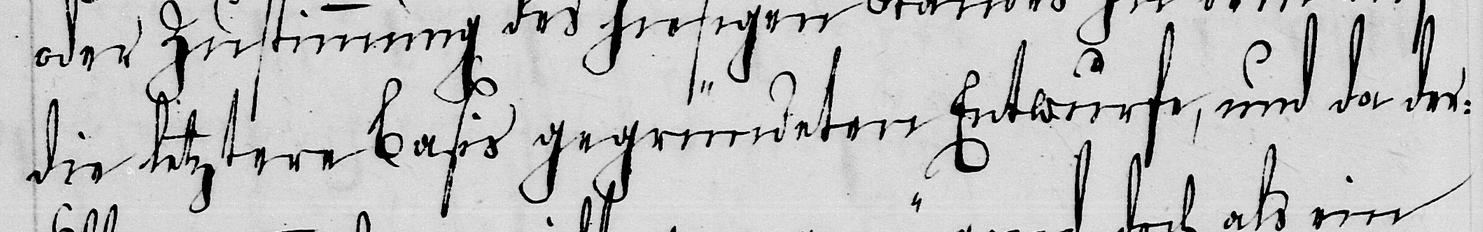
die letztere Basis gegründeten Entwurfe, und da de¬
